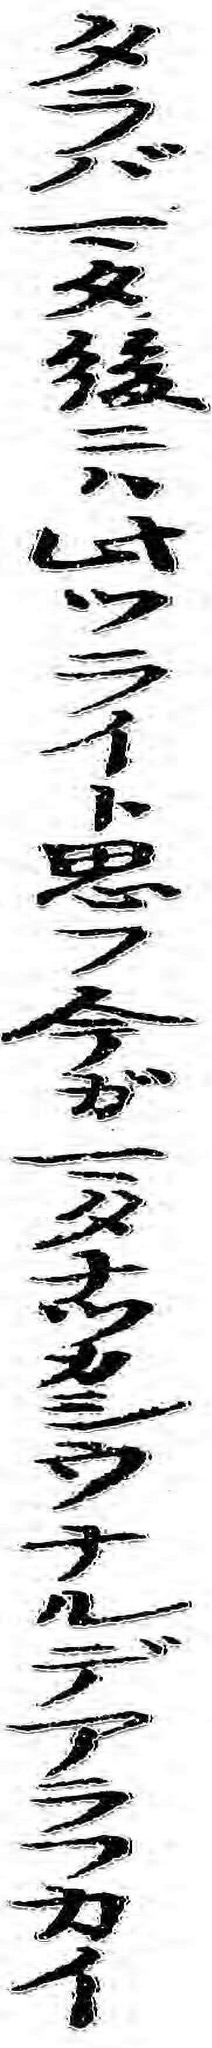タラバマタ後ニハ此ツライト思フ今ガマタナツカシウナルデアラフカイ
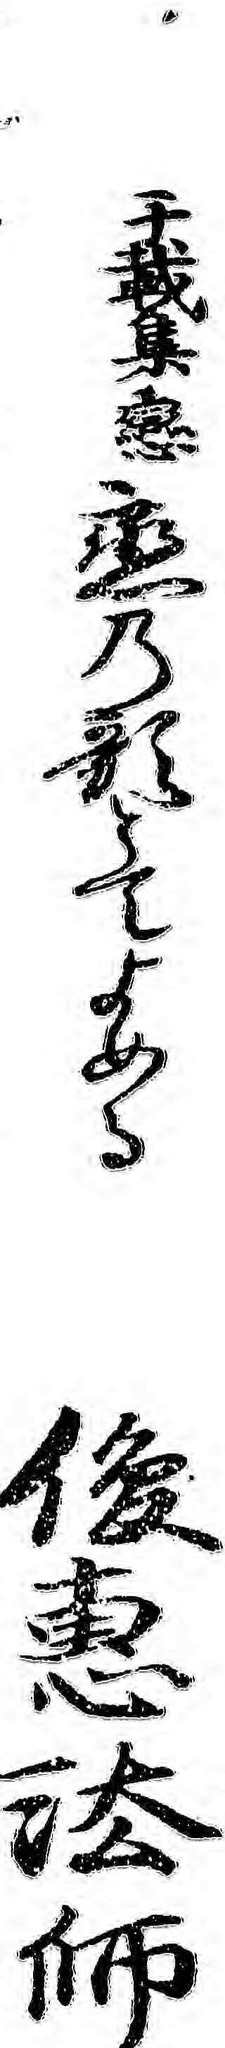千載集恋恋の歌とてよめる俊恵法師
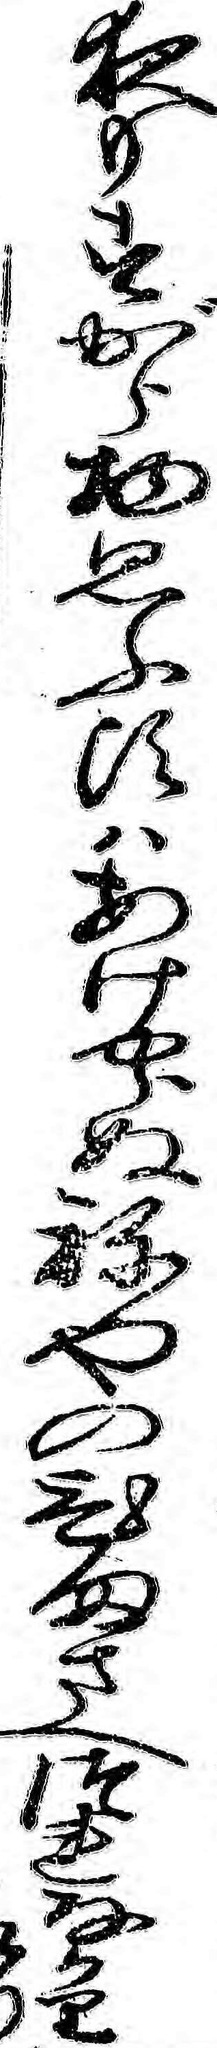夜もすがら物思ふ頃は明けやらぬねやのひまさへつれなかりけり
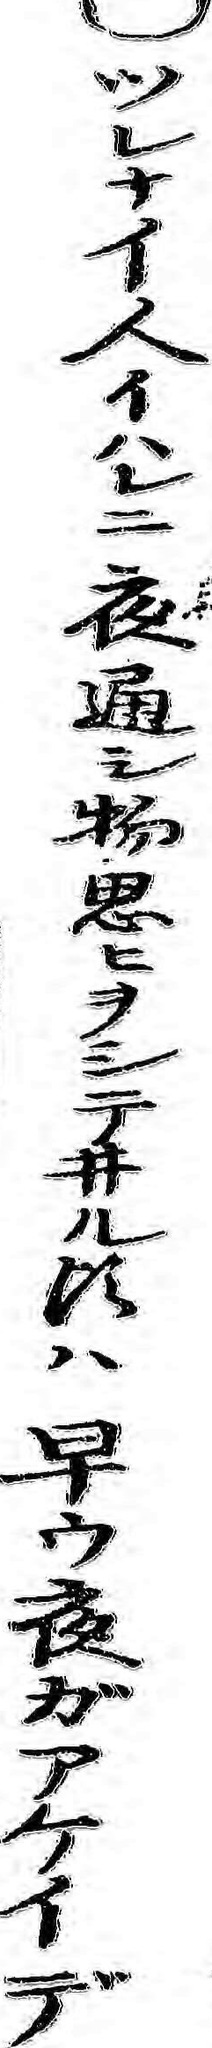◯ツレナイ人イハレニ夜通シ物思ヒヲシテヰル頃ハ早ウ夜ガアケイデ
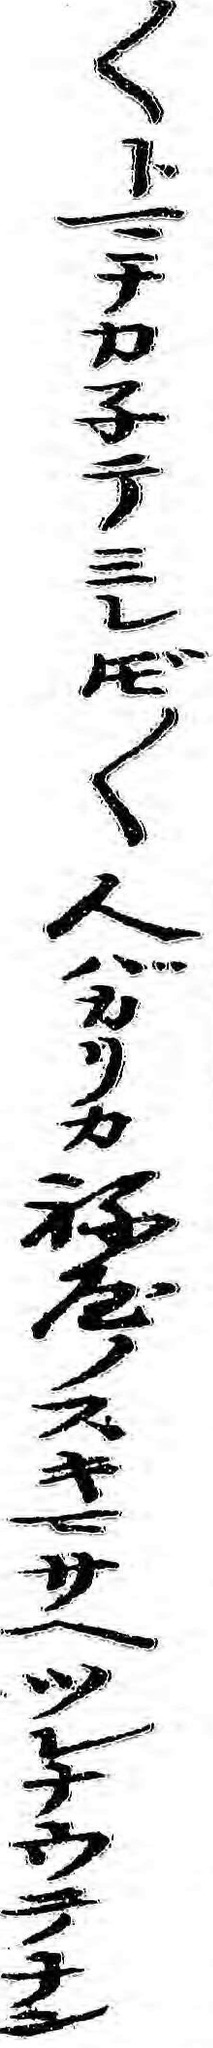〳〵トマチカネテミレドモ〳〵人バカリカね屋ノスキマサヘツレナウテナン
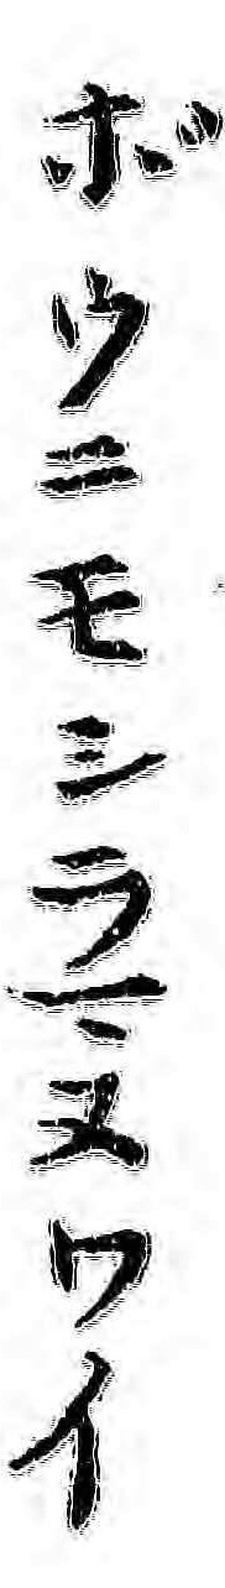ボウニモシラマヌワイ
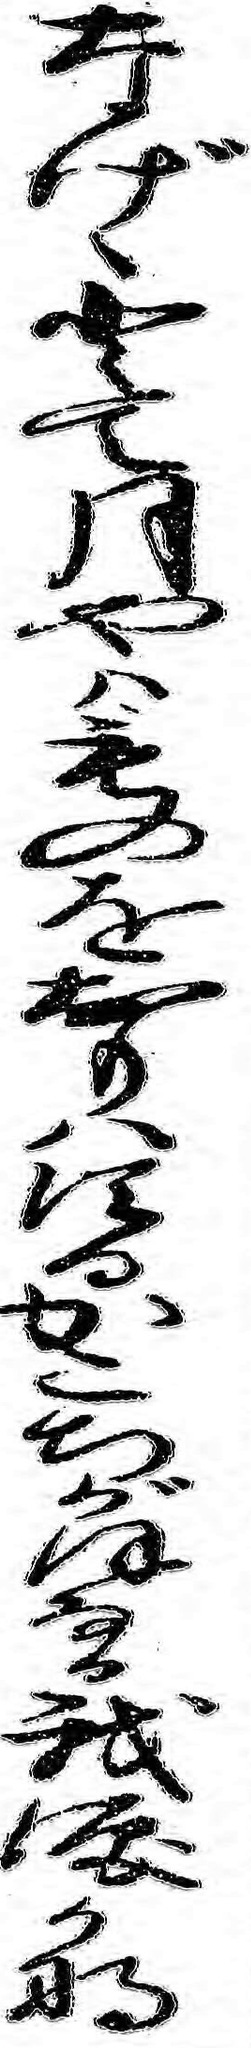なげゝとて月やはものをおもはするかこちがほなる我涙かな
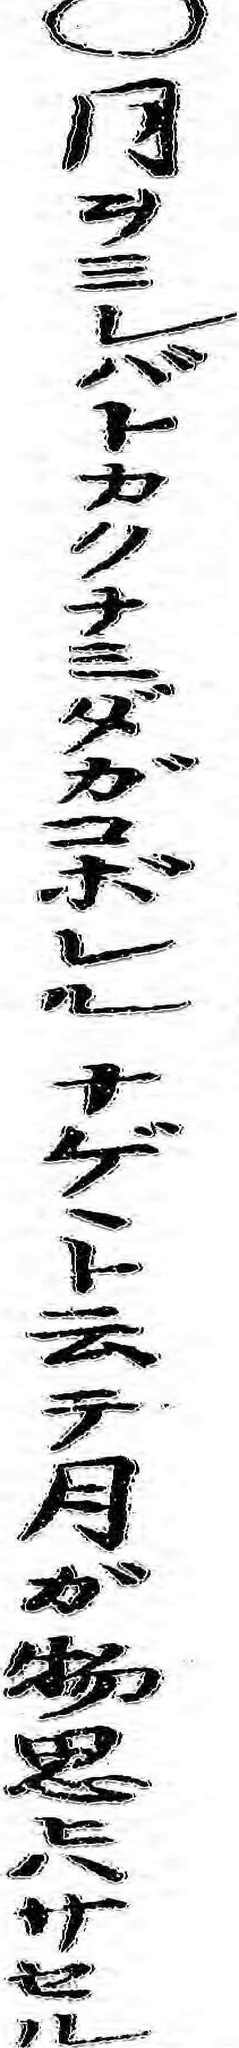◯月ヲミレバトカクナミダガコボレルナゲゝト云テ月ガ物思ヒハサセル
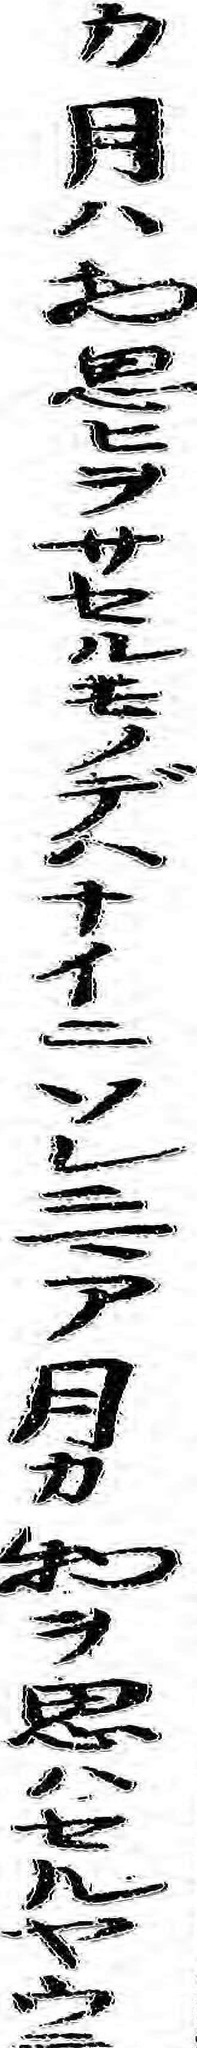カ月ハ物思ヒヲサセルモノデハナイニソレニマア月カ物ヲ思ハセルヤウニ
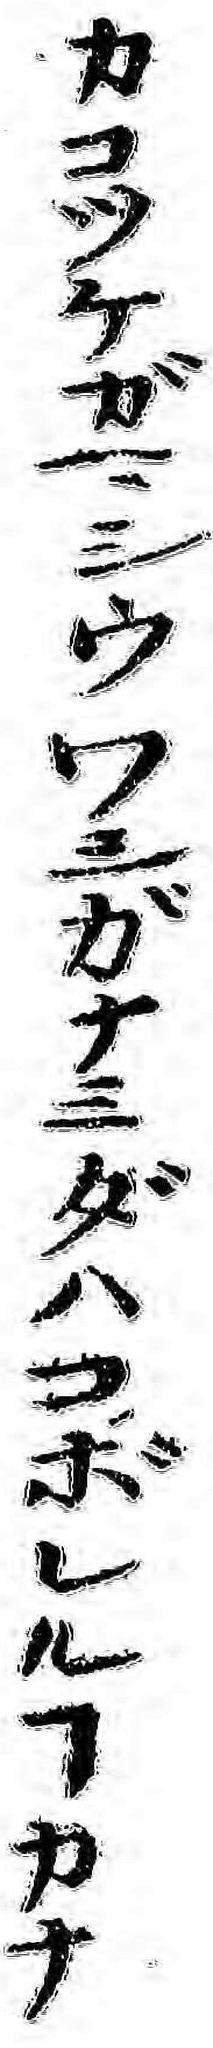カコツケガマシウワシガナミダハコボレルコトカナ
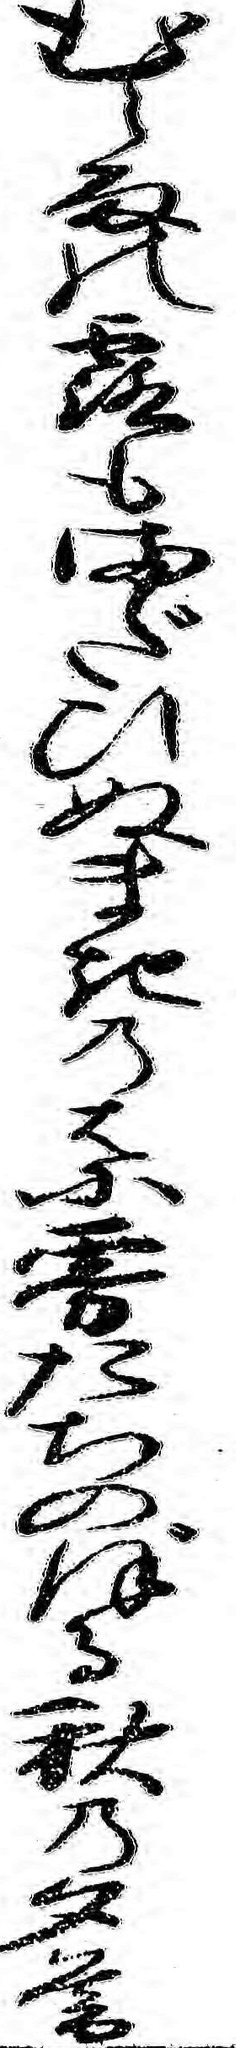むら雨の露もまだひぬまきのはに霧たちのぼる秋の夕暮
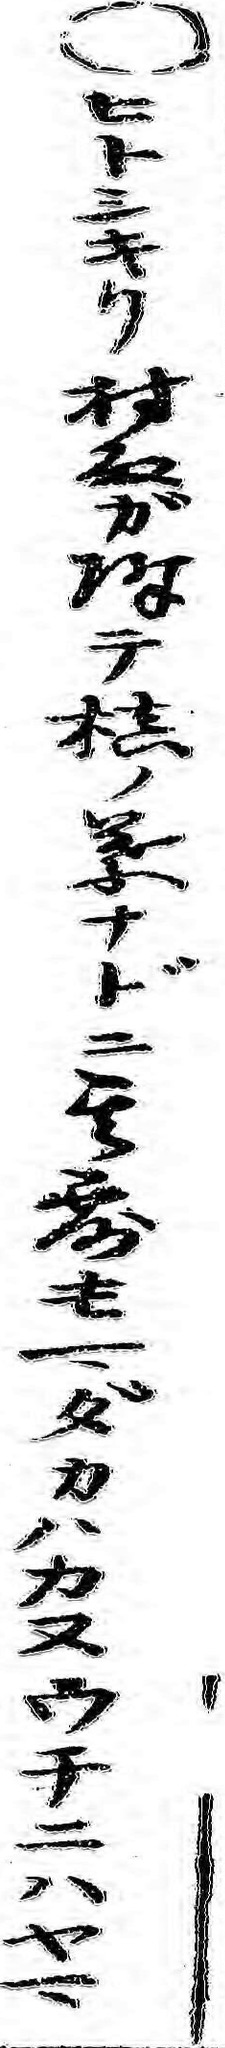◯ヒトシキリ村雨ガ降テ槙ノ葉ナドニ其露モマダカハカヌウチニハヤマ
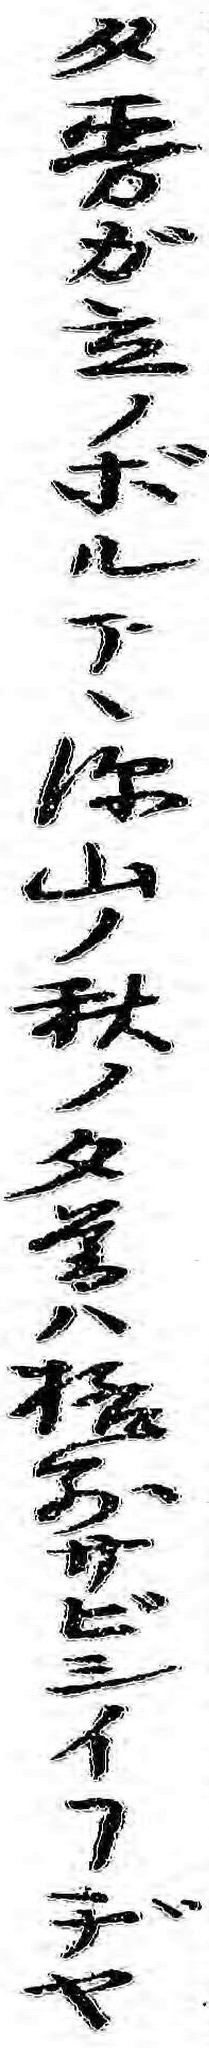タ霧ガ立ノボルアゝ深山ノ秋ノ夕暮れハ格別サビシイコトヂヤ
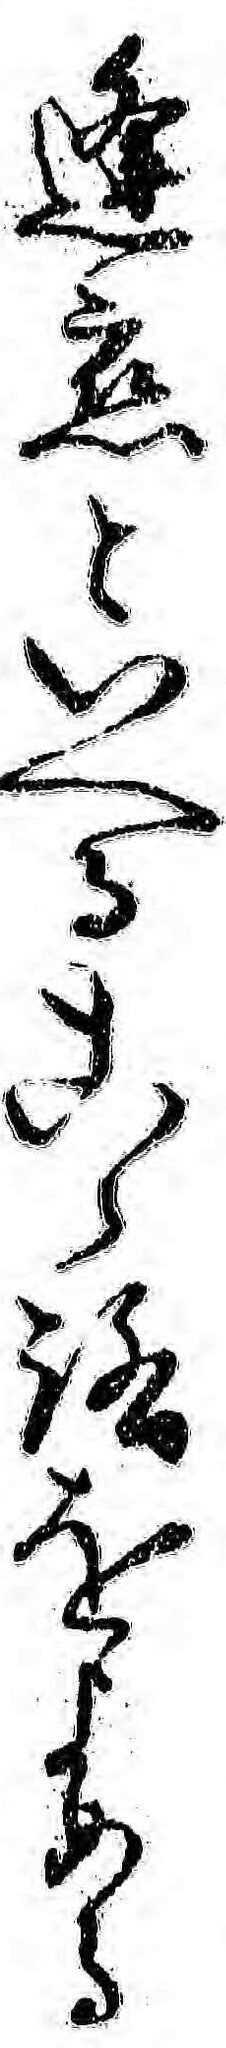逢恋といへるこゝろをよめる

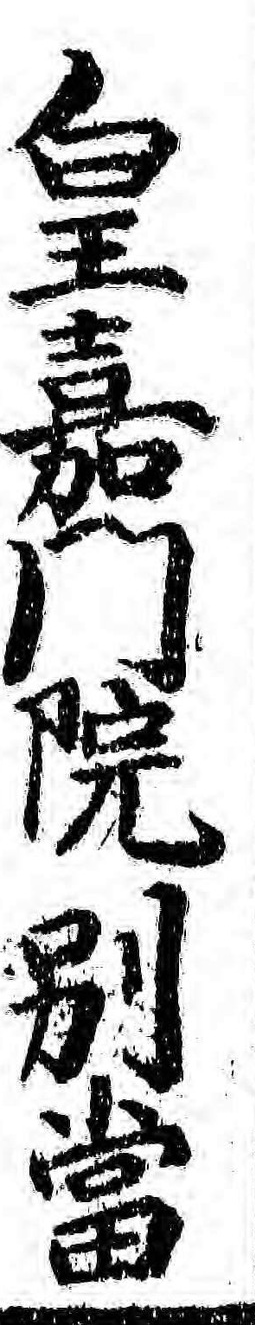皇嘉門院別当
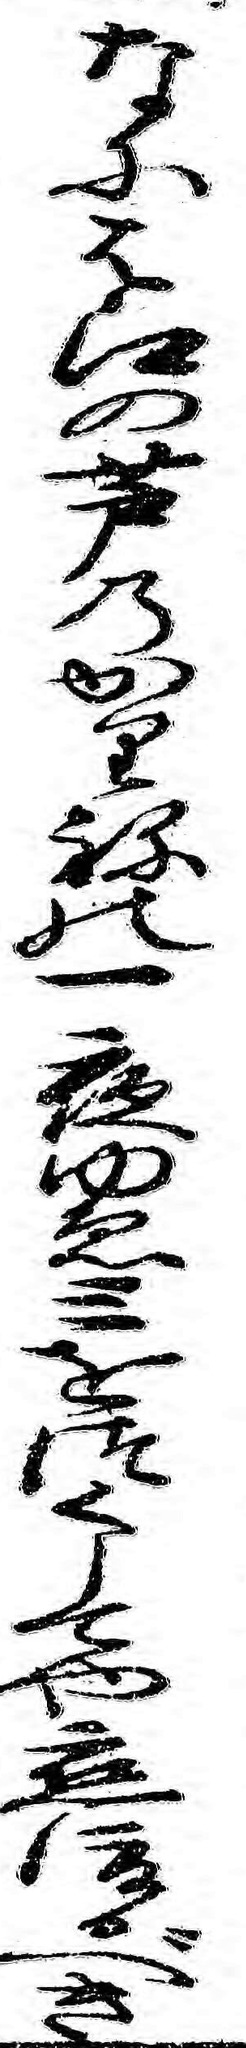なには江の芦のかりねの一夜ゆゑみをつくしてや恋渡るべき
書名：百人一首／小倉の山ふみ
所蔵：国文学研究資料館
